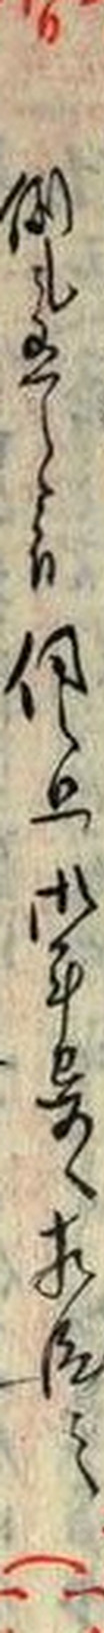例も有之候ニ付伺之上御年寄へ相渡之
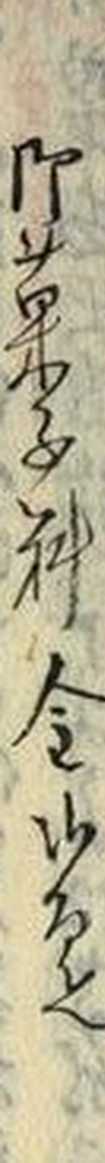御菓子料金弐百疋
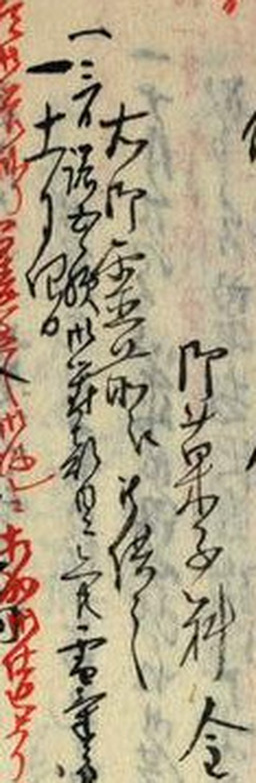右御霊前江被供之
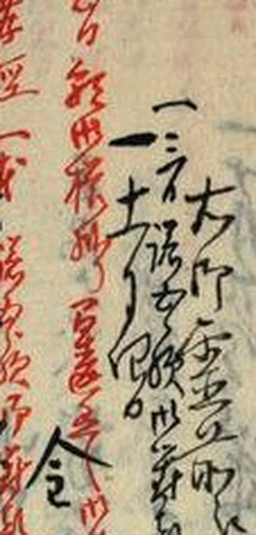一十一月四日
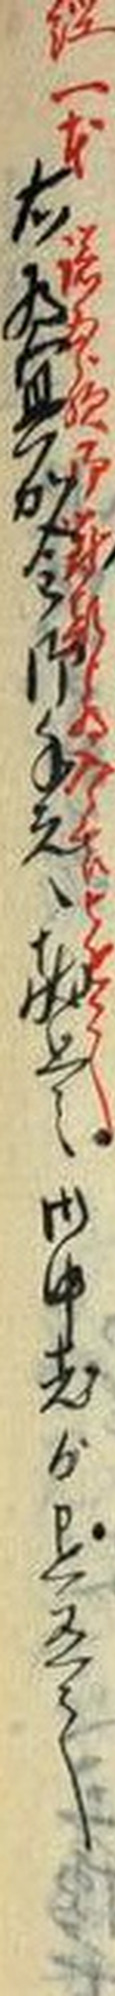右為冥加金御手元へ献上之御中老ゟ申上有之
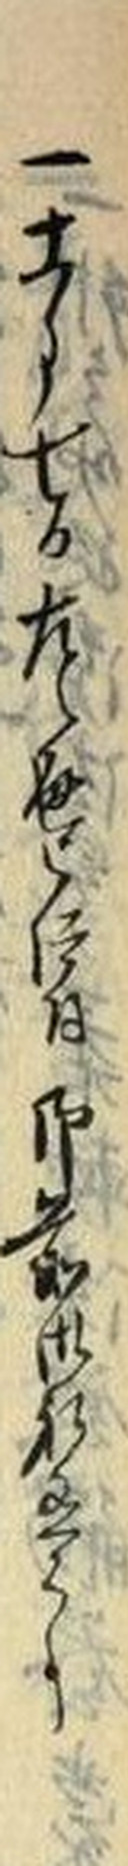一十一月七日左之通被仰付御前御礼有之
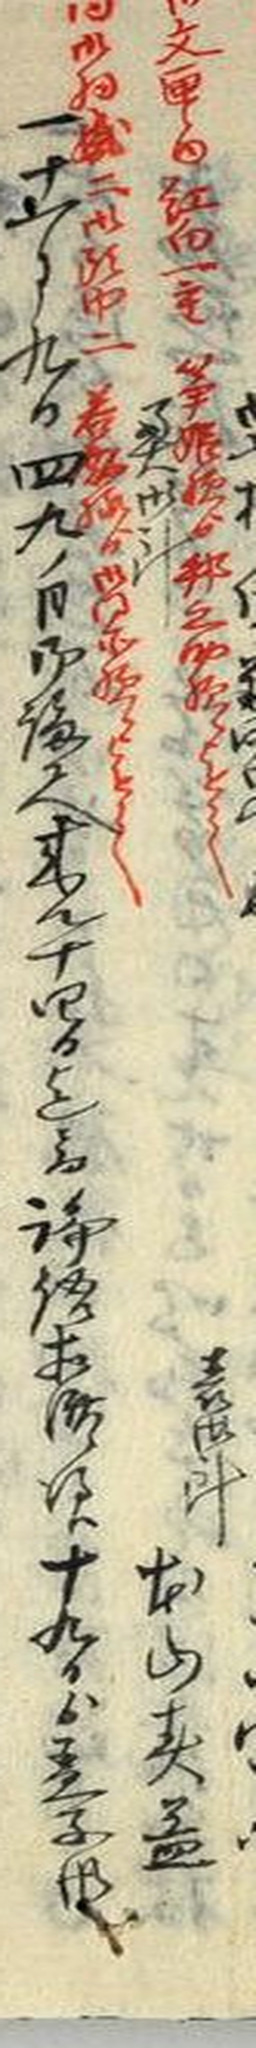一十一月九日四九ノ日御講尺来ル十四日迄ニ而論語相済候得ハ十九日ゟ孟子御
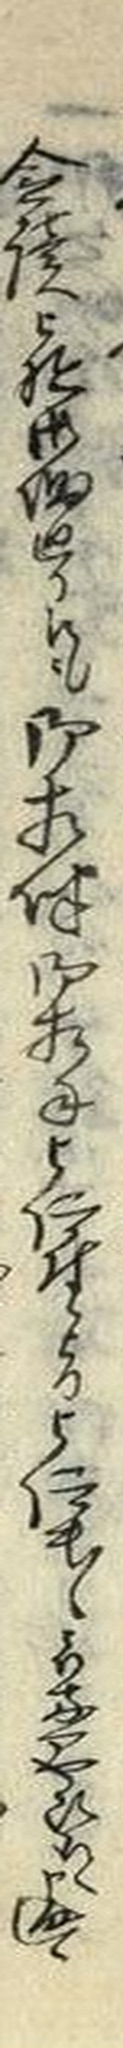会読被遊御側廻り江も御相伴御相手被仰付候旨被仰出候ニ付両部や頭取へ申通候
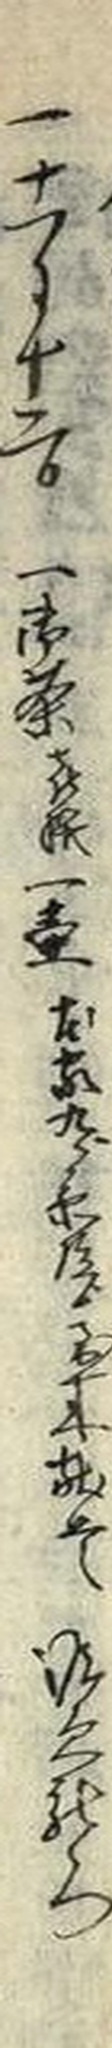一十一月十二日一御茶喜撰一壺本家九郎兵衛殿ゟ到来献上之渥美新右衛門
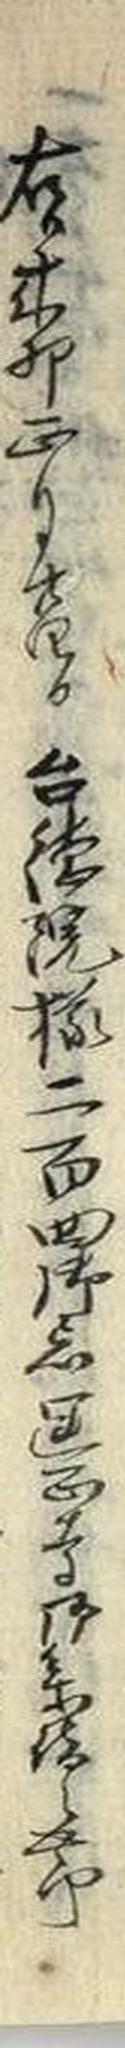右ハ来卯正月廿四日台徳院様二百回御忌運正寺御参詣之節
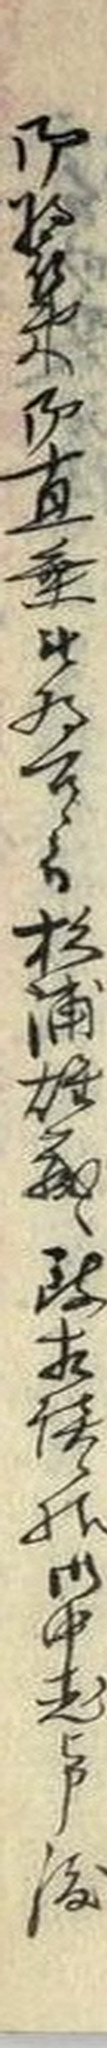御装束御直垂被為召候ニ付松浦雄蔵へ致相談候様御中老被申渡
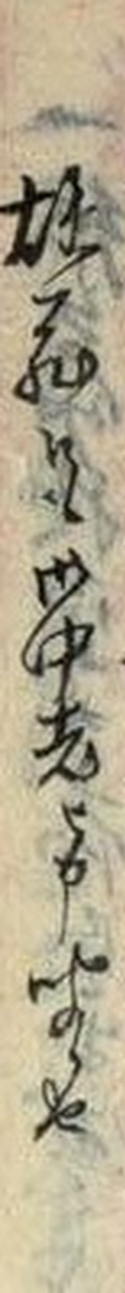雄蔵江も御中老被申聞候由

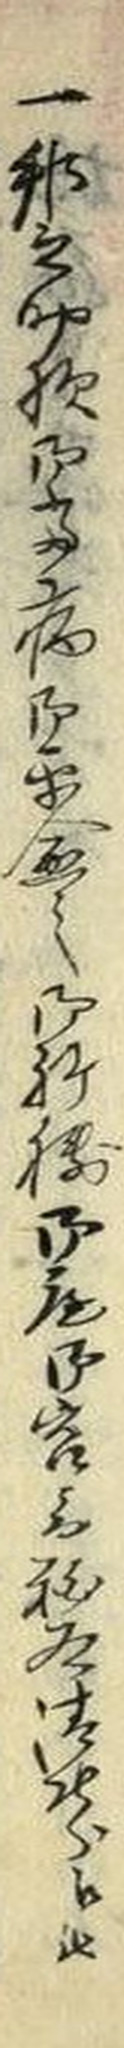一邦之助様御当病御平愈之御祈祷御庭御宮ニ而粕谷清次郎江被
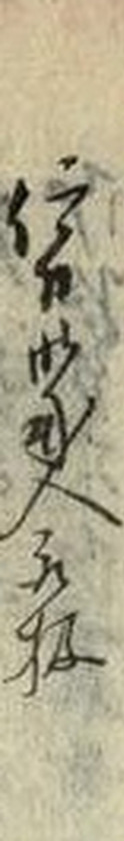仰付御用人取扱
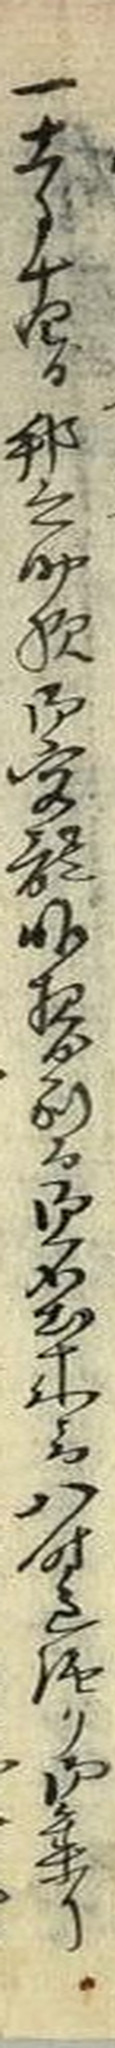一十一月十四日邦之助様御容体昨夜ゟ別而御不出来ニ而八時過ク御集り
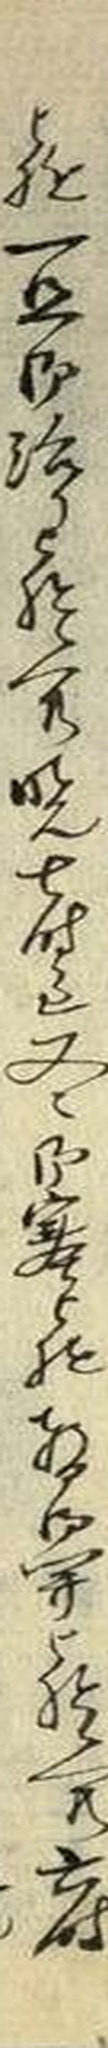被遊一旦御治り被遊候へ共暁七時過又々御塞被遊暫御開被遊候へ共六時
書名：少傅日録抄（斉承付側向頭取日記、在国）
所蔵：福井県文書館 Fukui Prefectural Archives
